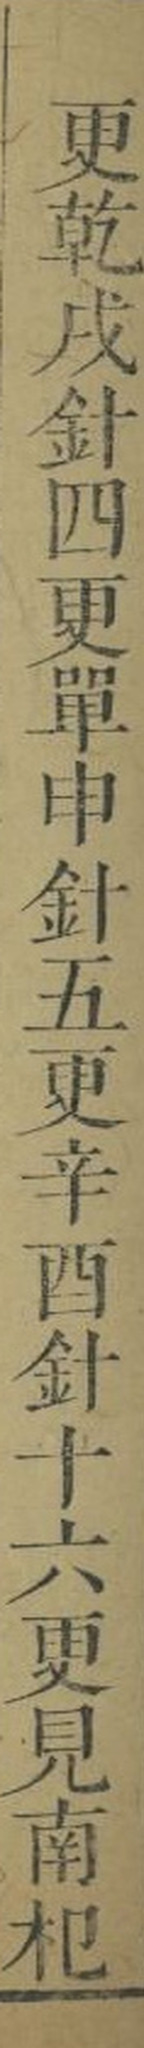更乾戌針四更單申針五更辛酉針十六更見南杞
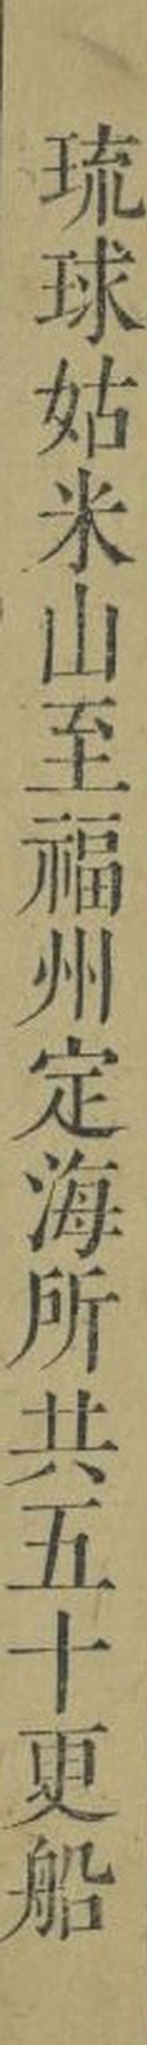琉球姑米山至福州定海所共五十更船
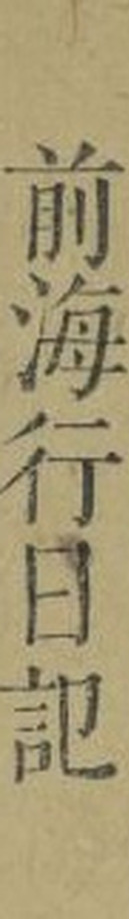前海行日記
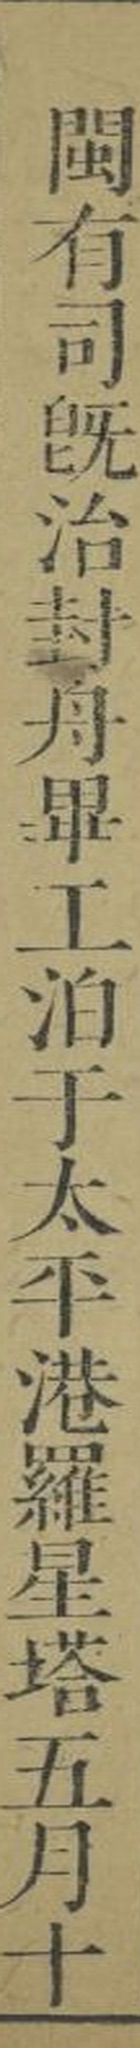閩有司既治封舟畢工泊于太平港羅星塔五月十
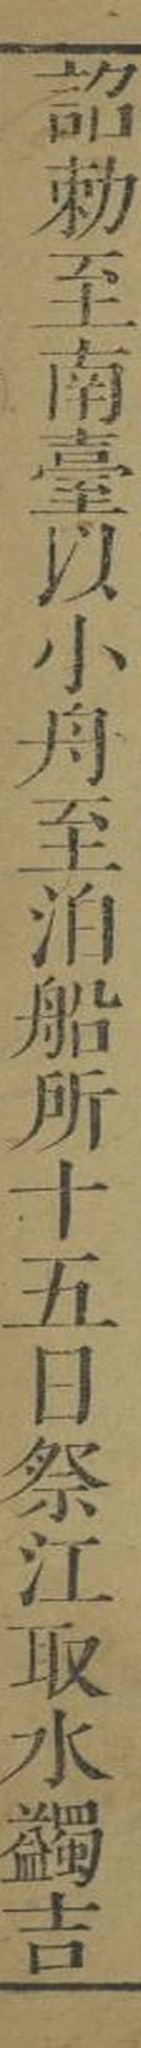詔勅至南臺以小舟至泊船所十五日祭江取水蠲吉

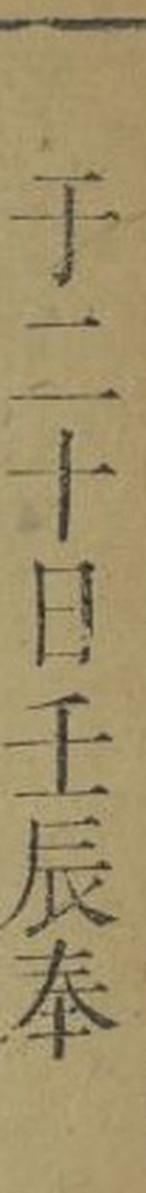于二十日壬辰奉
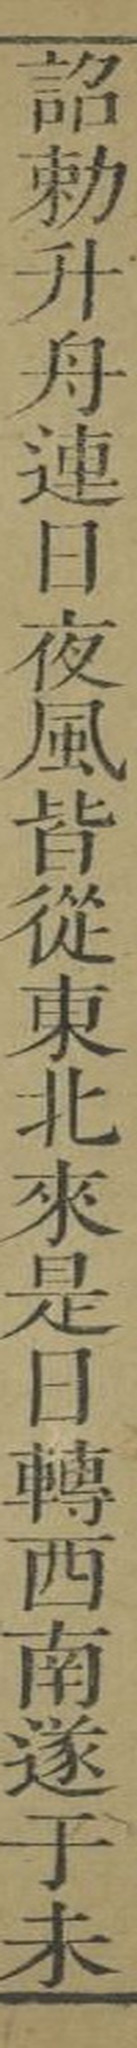詔勅升舟連日夜風皆從東北來是日轉西南遂于未
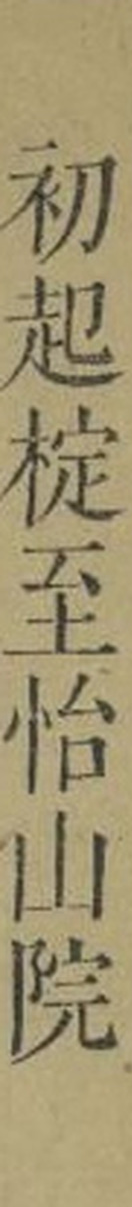初起椗至怡山院
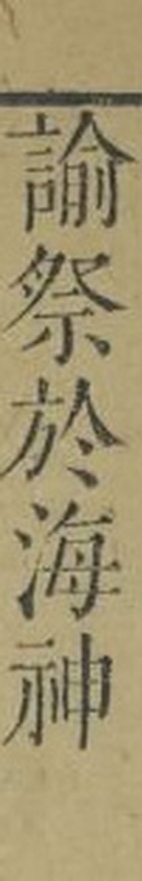諭祭於海神
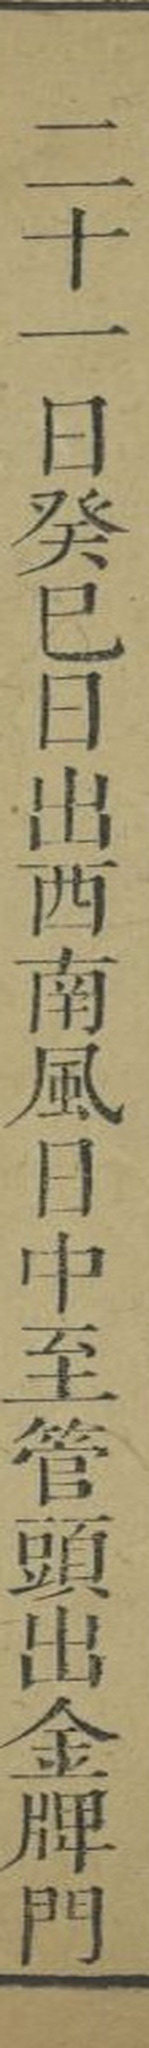二十一日癸巳日出西南風日中至管頭出金牌門
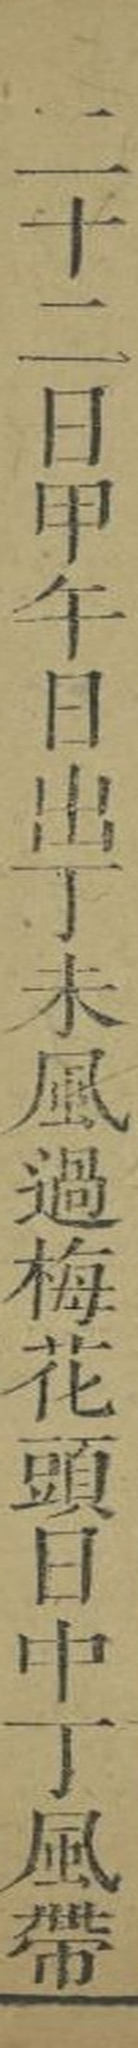二十二日甲午日出丁未風過梅花頭日中丁風帶
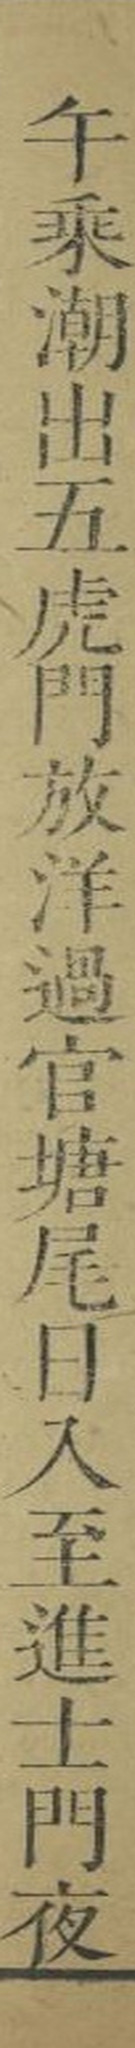午乘潮出五虎門放洋過官塘尾日入至進士門夜
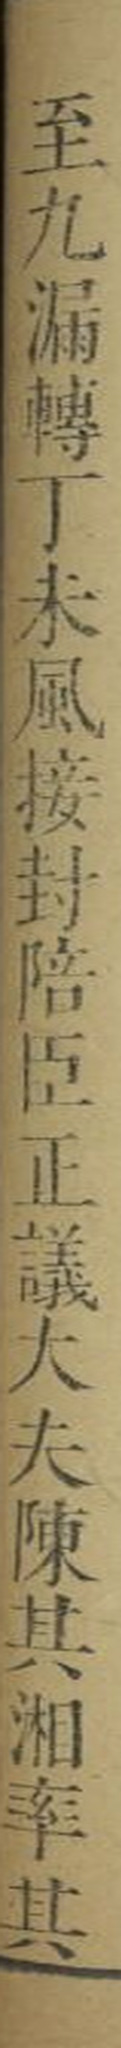至九漏轉丁未風接封陪臣正議大夫陳其湘率其
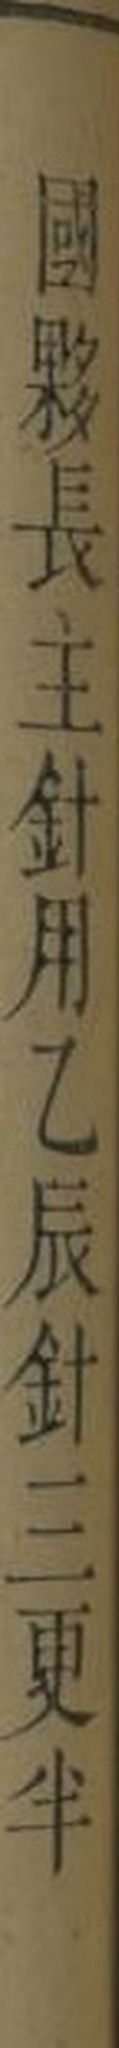國夥長主針用乙辰針三更半
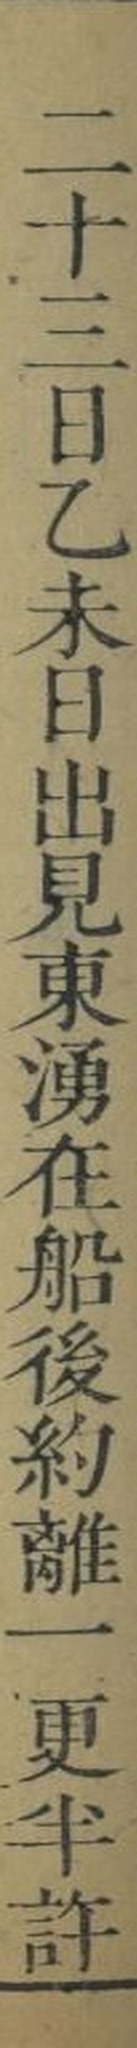二十三日乙未日出見東湧在船後約離一更半許
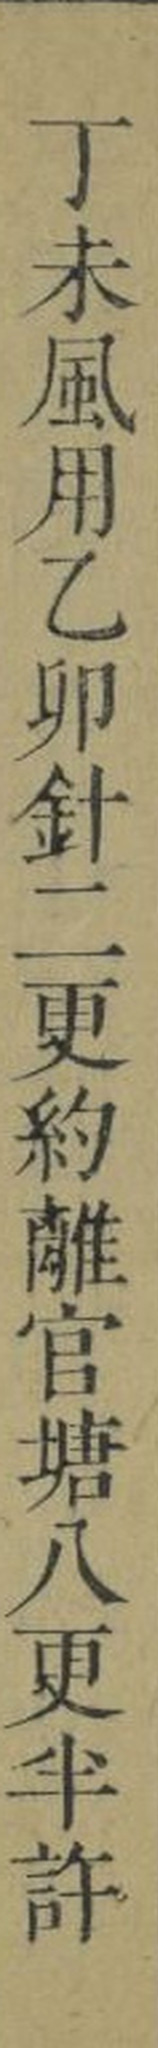丁未風用乙卯針二更約離官塘八更半許
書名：中山伝信録 巻一
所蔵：University of the Ryukyus Library
